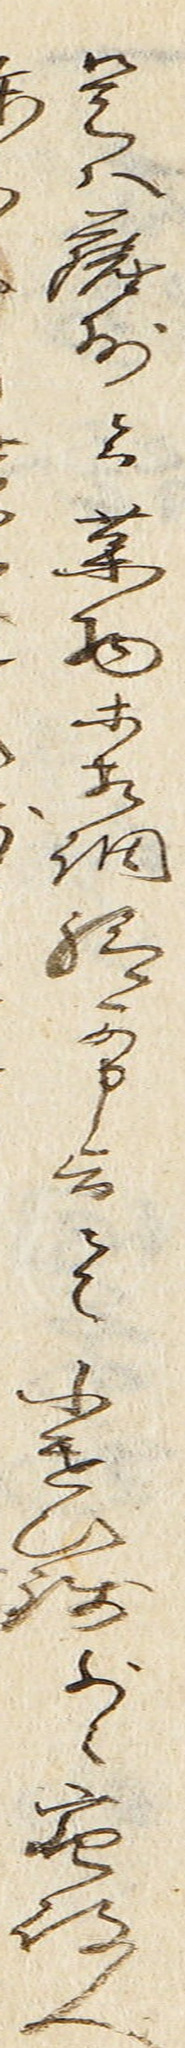是は薩州に而薬物等相調給可申旨にて小遣ひ銭少々宛役人
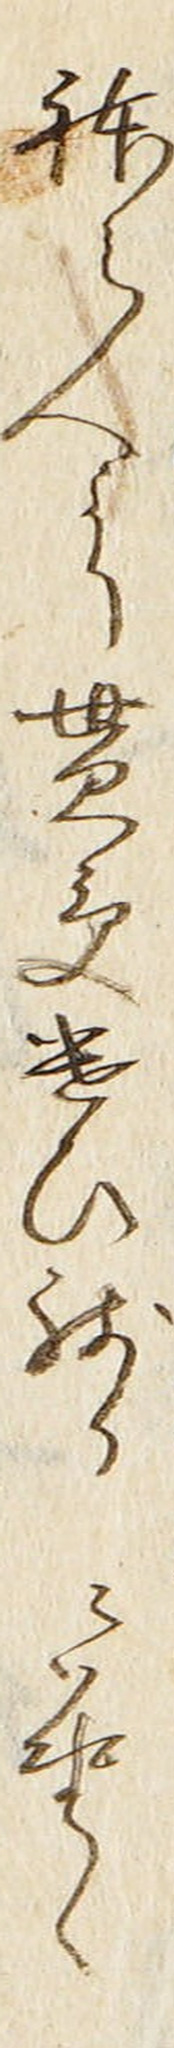躰之人より貰受遣ひ残りに御坐候
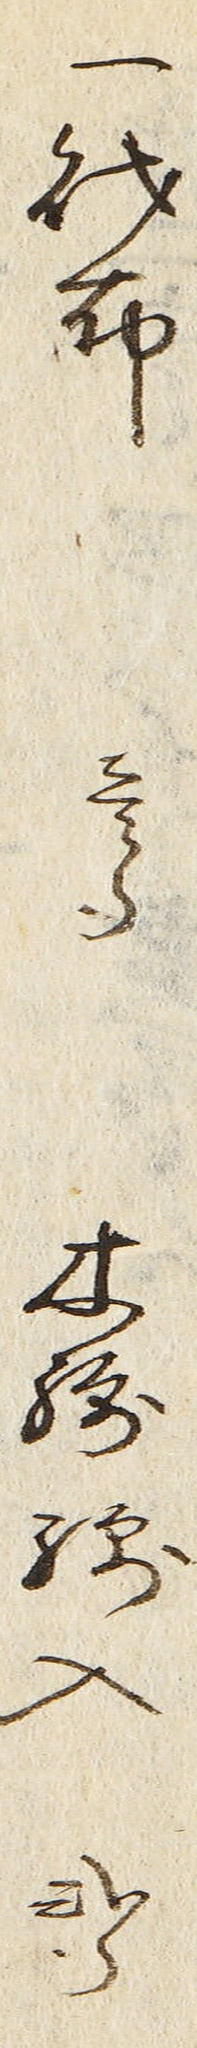一財布壱ツ木綿綿入弐ツ
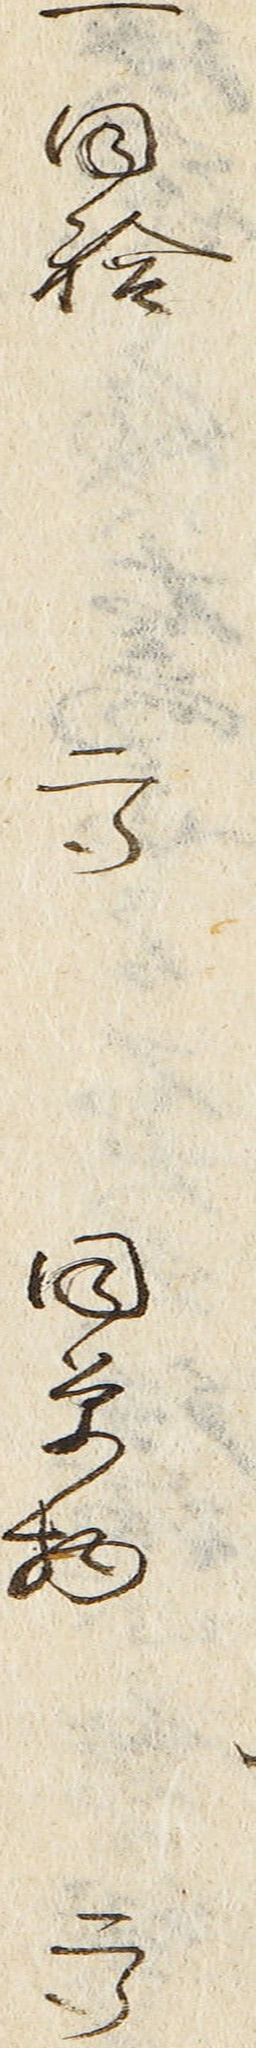一同袷二ツ同単物二ツ
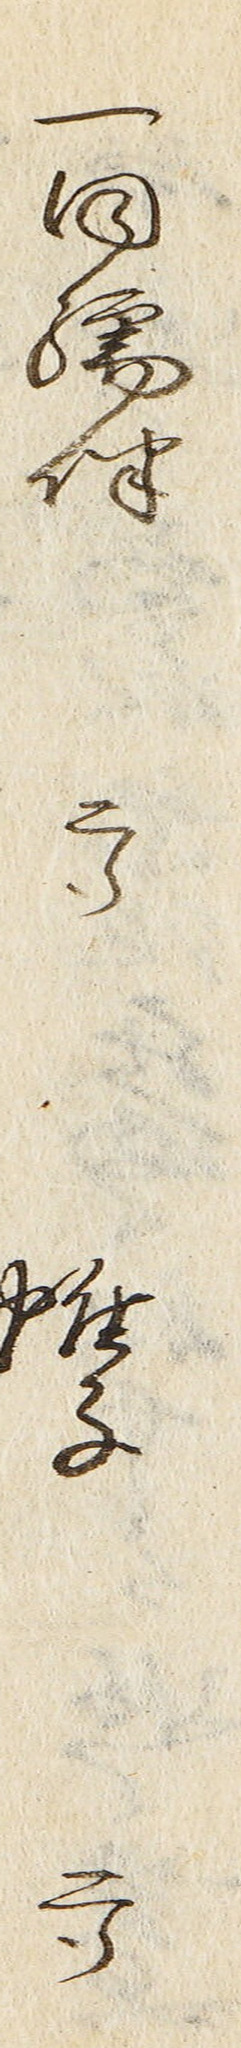一同襦袢二ツ帷子二ツ
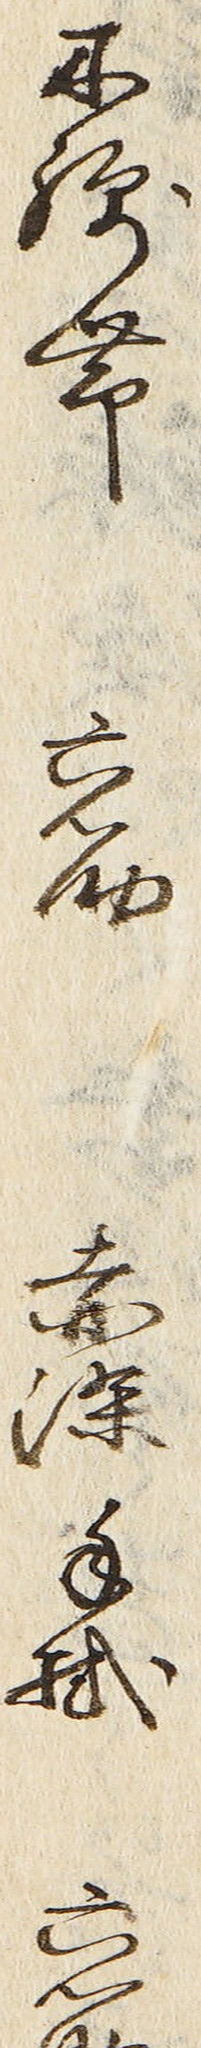一木綿帯六筋赤染手拭六筋
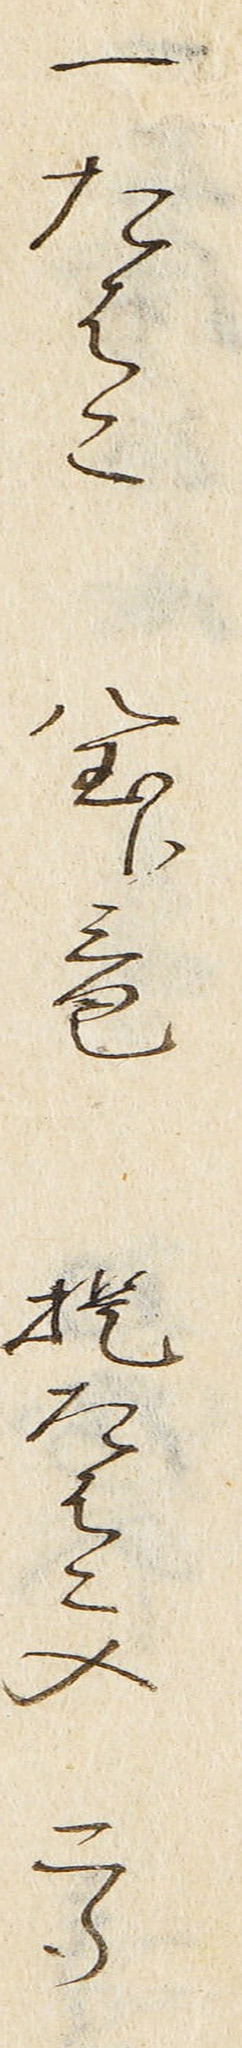一たはこ八玉分三包提たはこ入二ツ
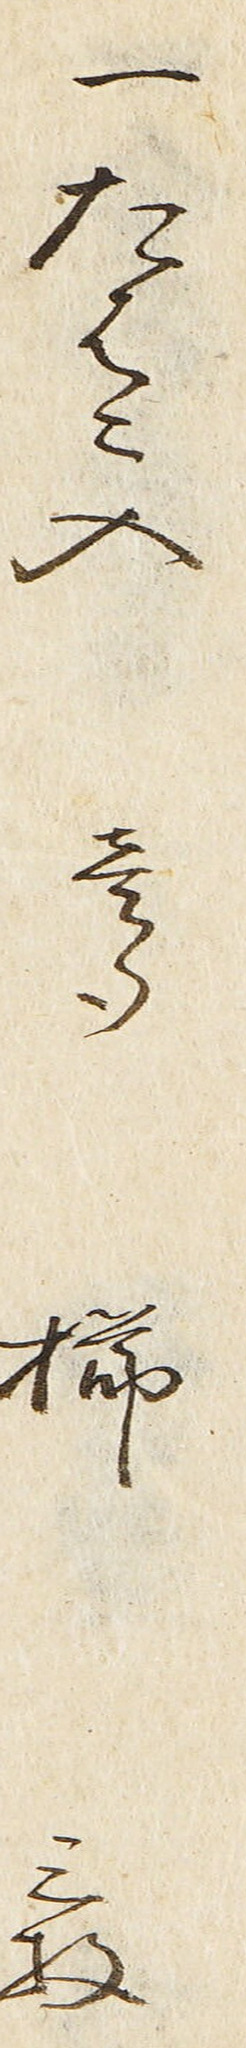一たはこ入壱ツ櫛三枚
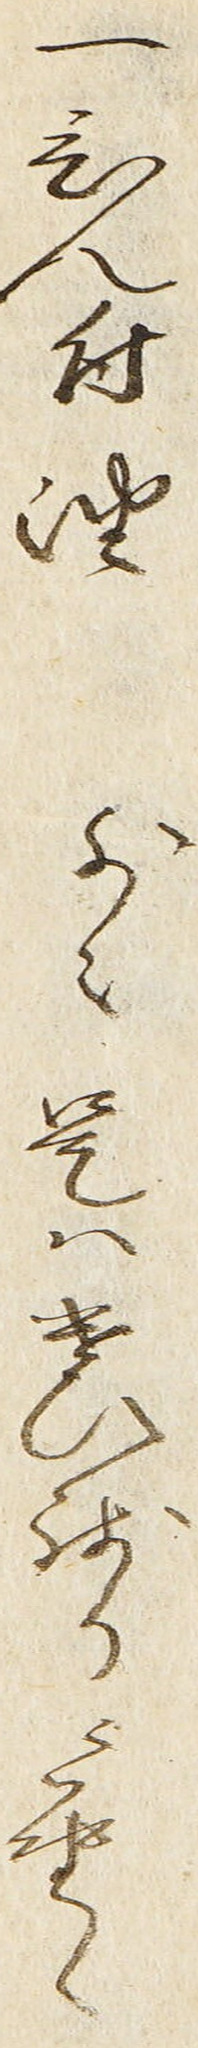一ひん付油少々是は遣ひ残りに御坐候
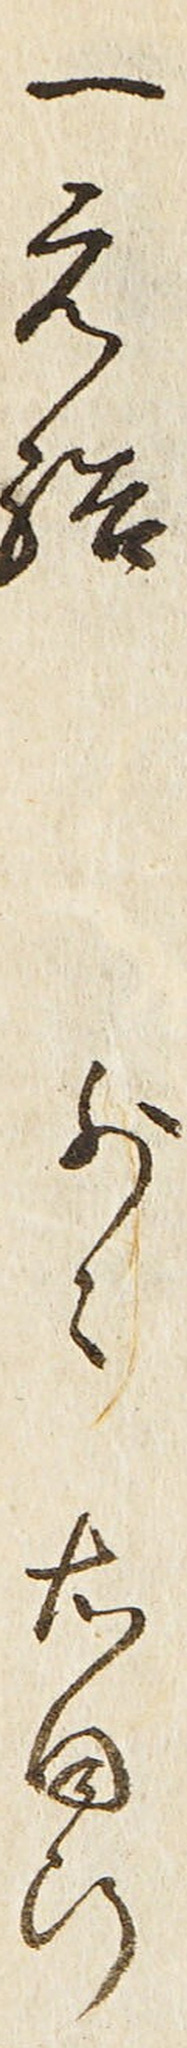一元結少々右同断
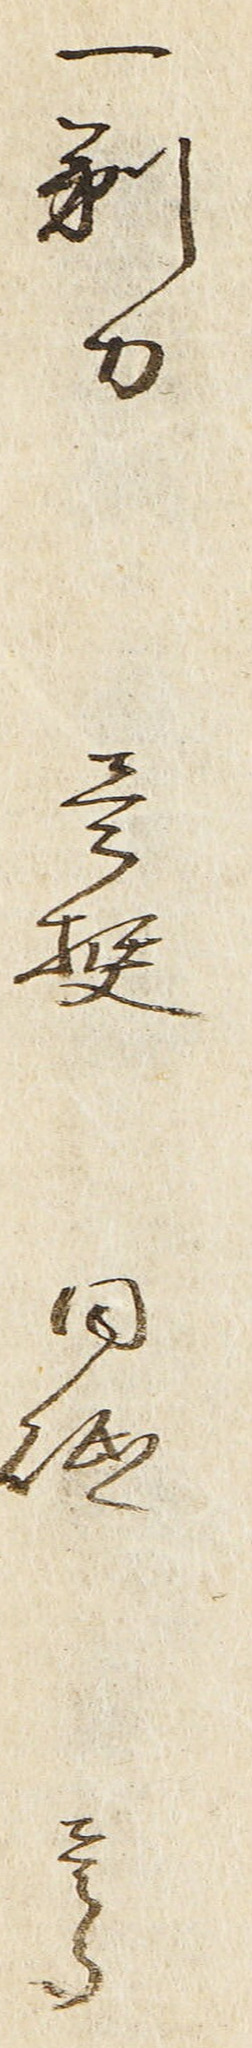一剃刀壱挺同砥壱ツ
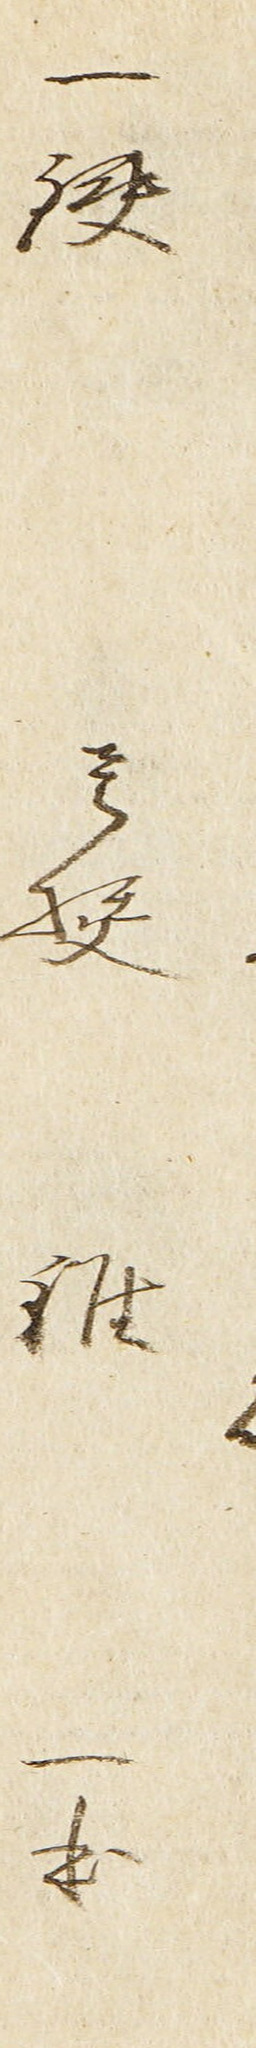一鋏壱挺錐一本
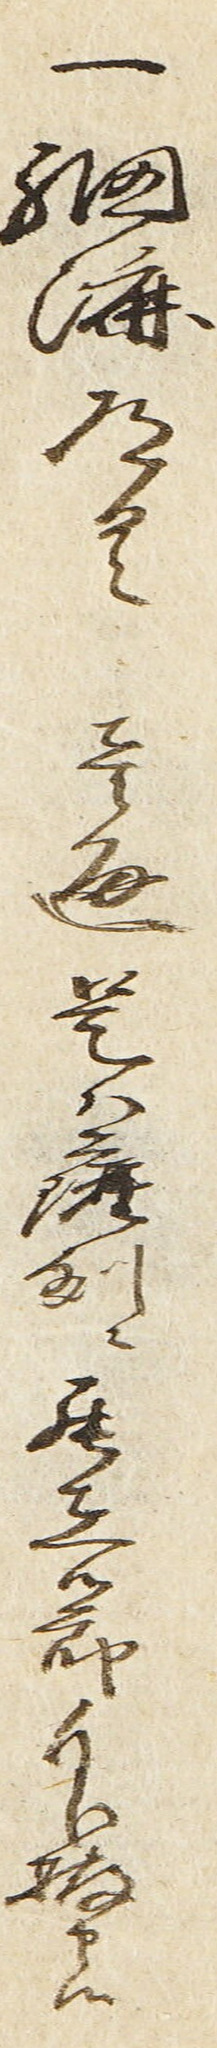一細漉道具壱通是は薩州に罷在候節自分拵申候
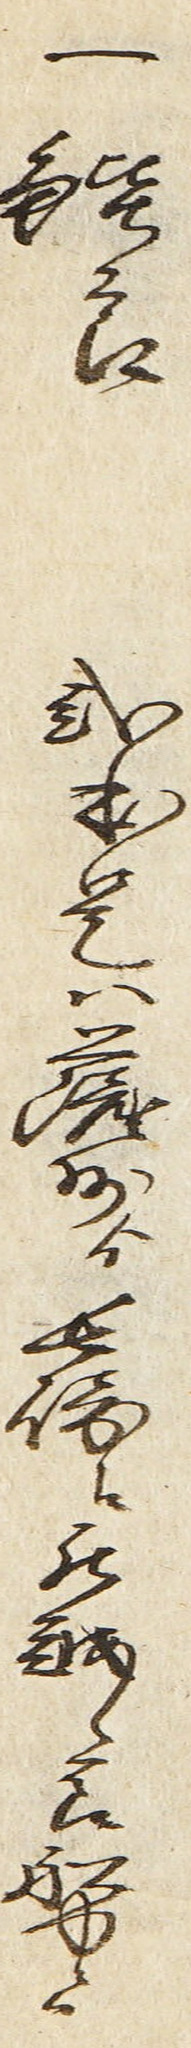一鰹節弐本是は薩州ゟ長崎え罷越候節船中に而
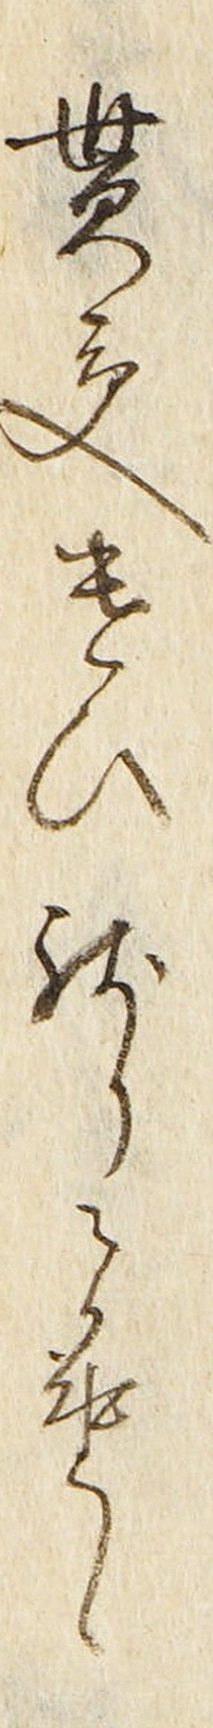貰受遣ひ残りに御坐候

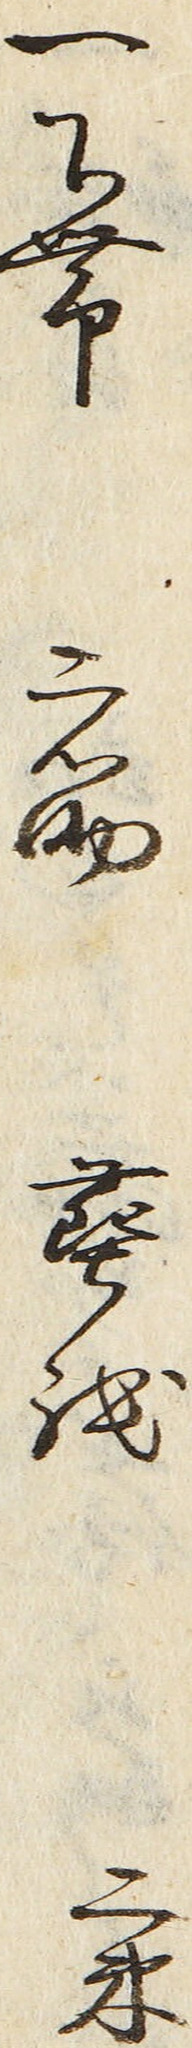一下帯二筋塵紙二束
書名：土佐中浜万次郎漂流記
